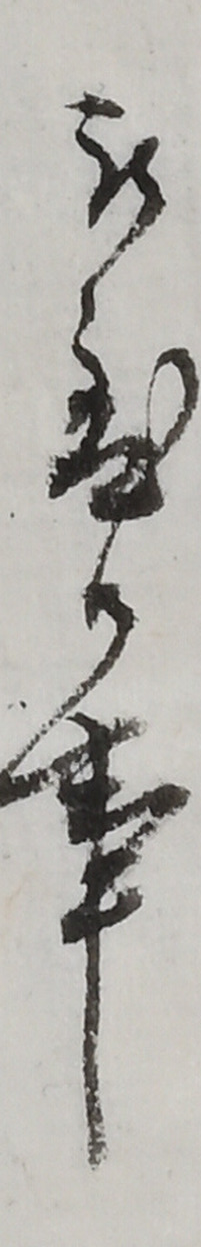被致候事
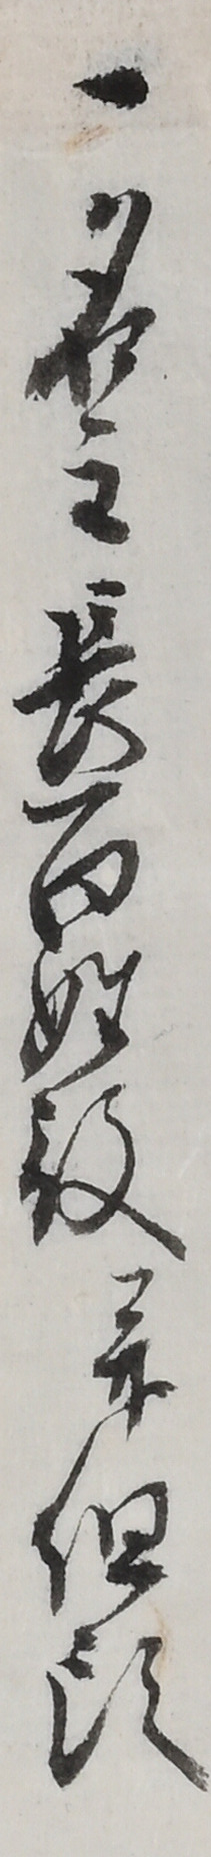一名主長百姓役并組頭
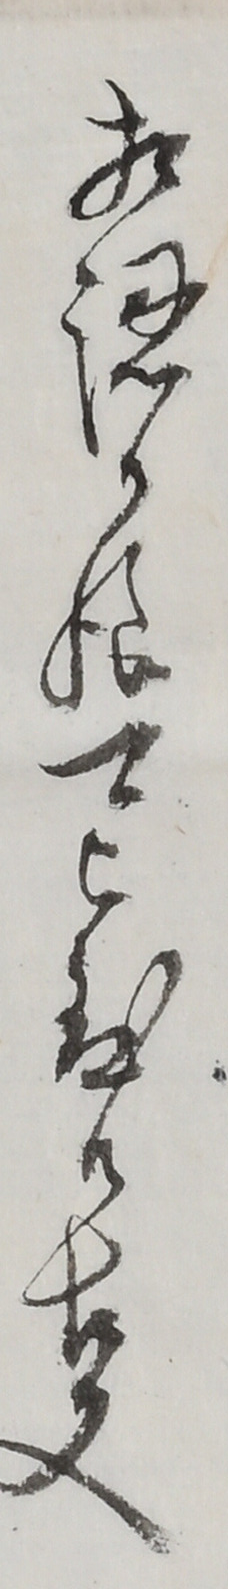相勤候様可被致候事
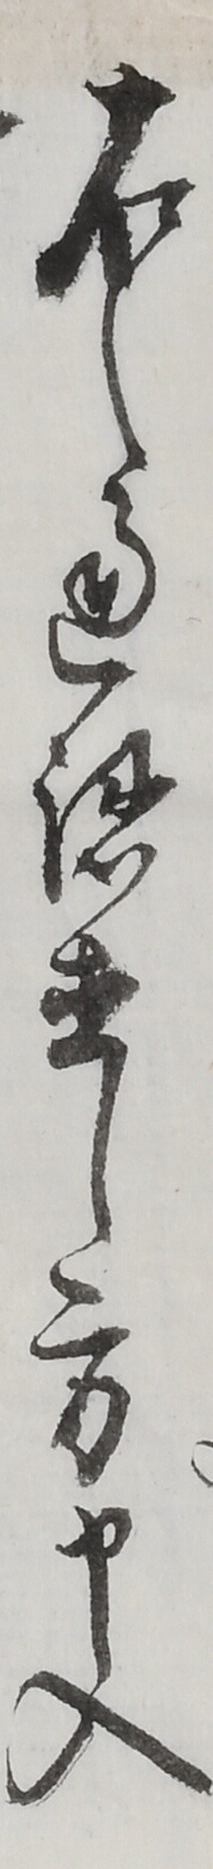右之通認直し方申入
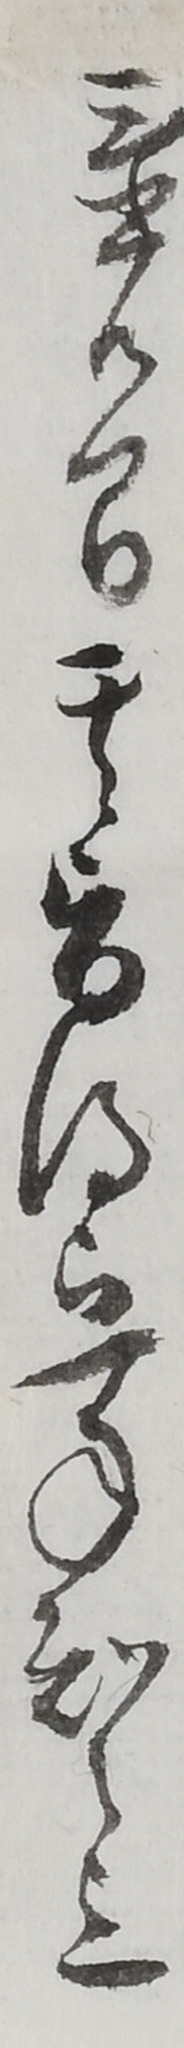置候間其旨得と承知之上

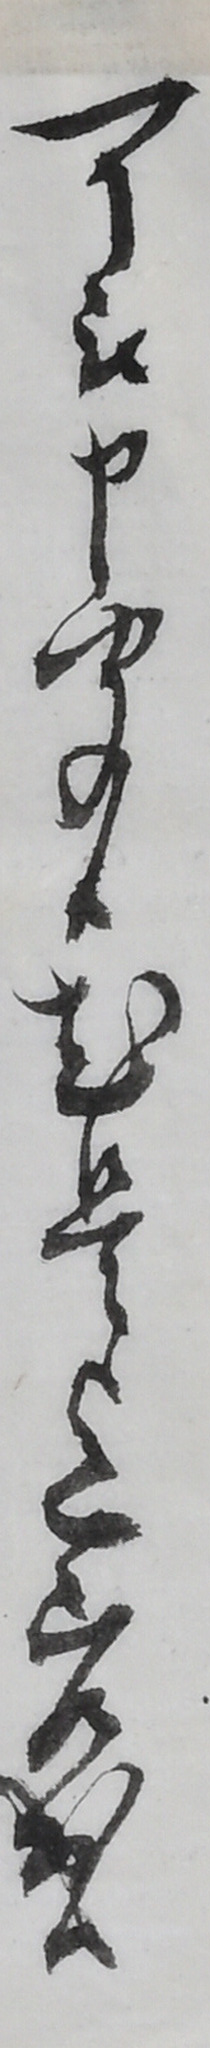可被申聞候尤是迄差出候
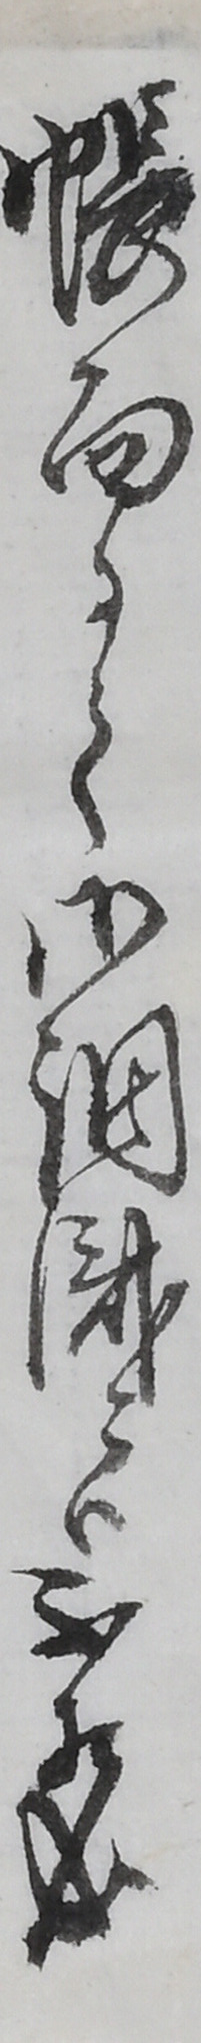帳面にて御調済ニハ不相成
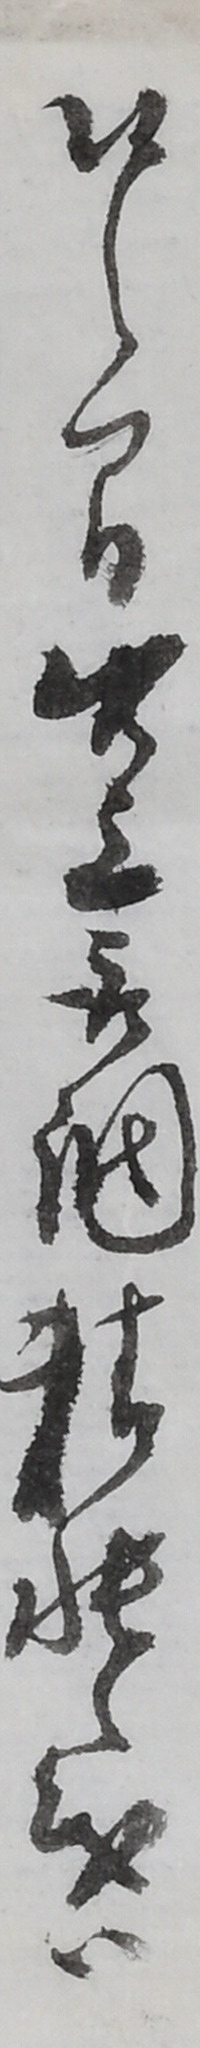候之間此上取調精帳之義ハ
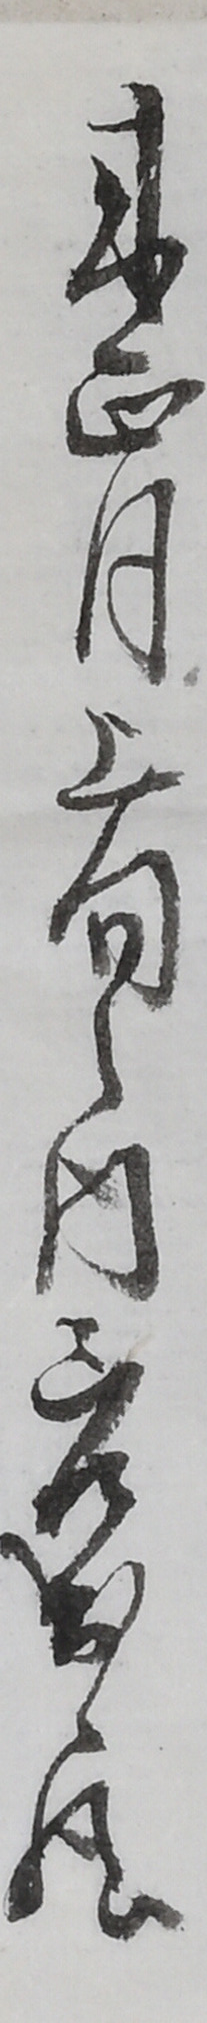来正月上旬之内差出候様
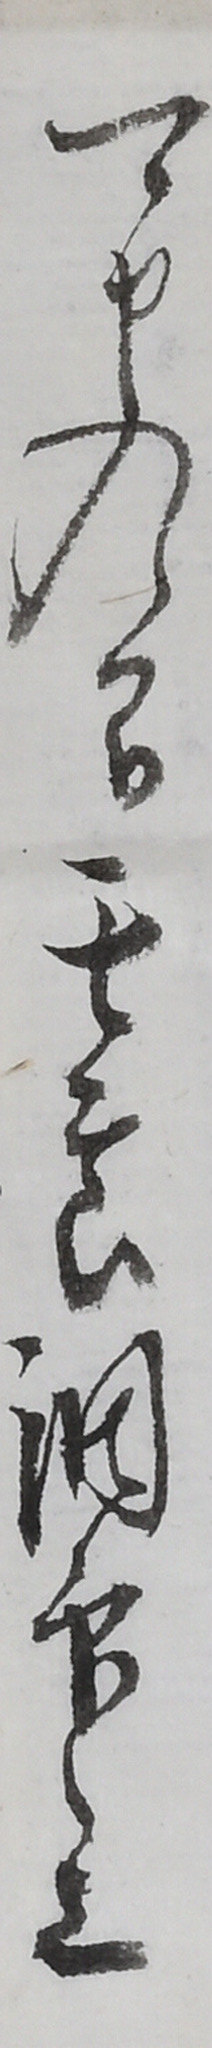可申入候間其節調印之上
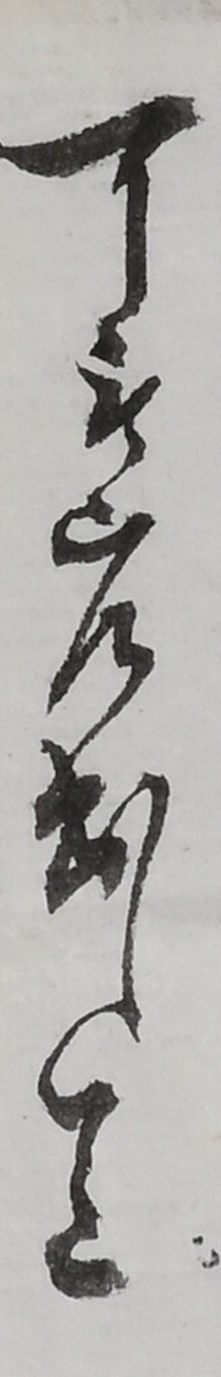可被差出候以上
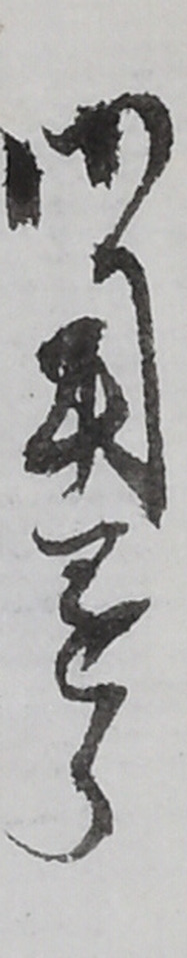御用懸り
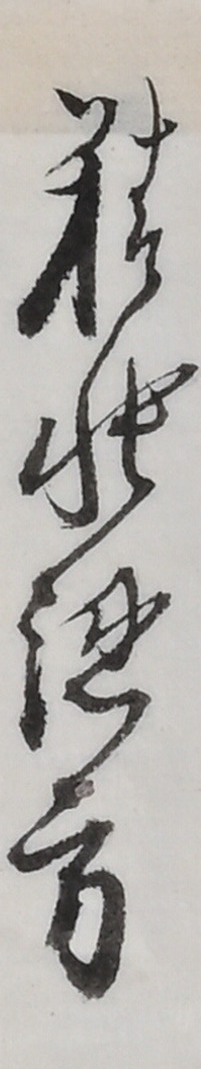精帳認方
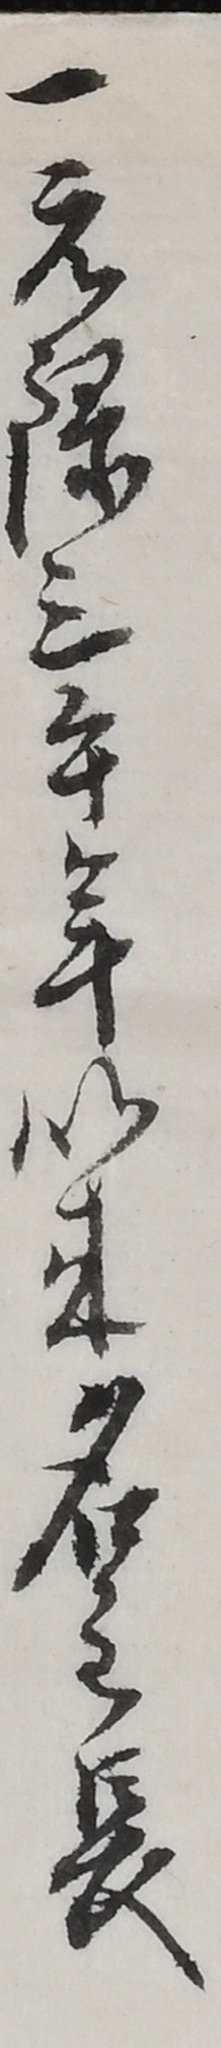一元禄三午年以来名主長
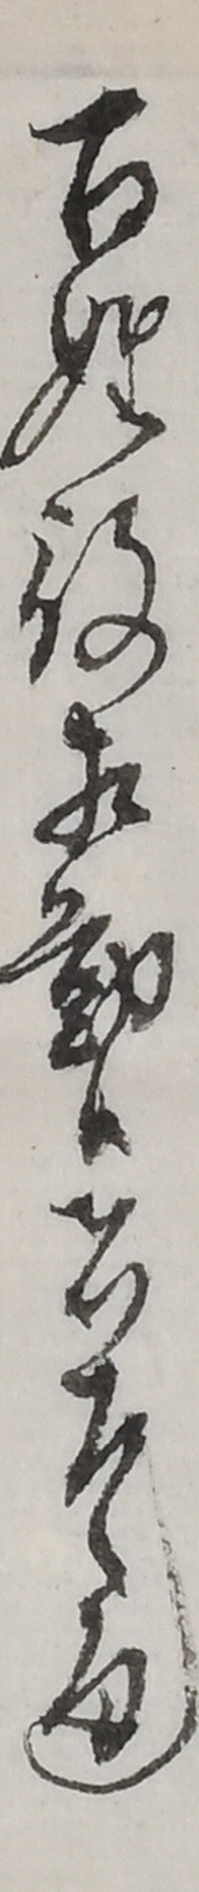百姓役相勤候は左之通
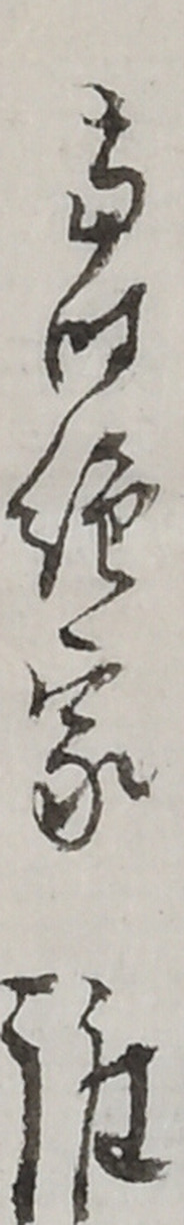当時絶家誰
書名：百五拾年御祝御用手控
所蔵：伊那市立高遠町図書館・合同会社AMANE
